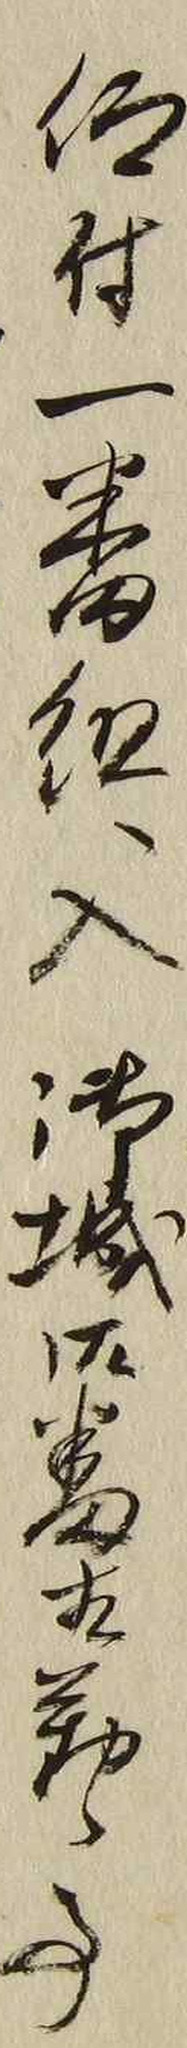仰付一番組へ入御城御番相勤候事
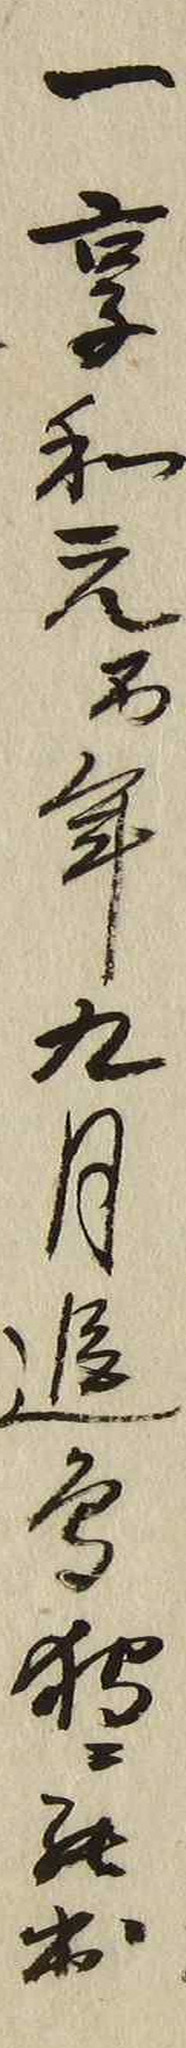一享和元酉年九月追鳥狩ニ罷出
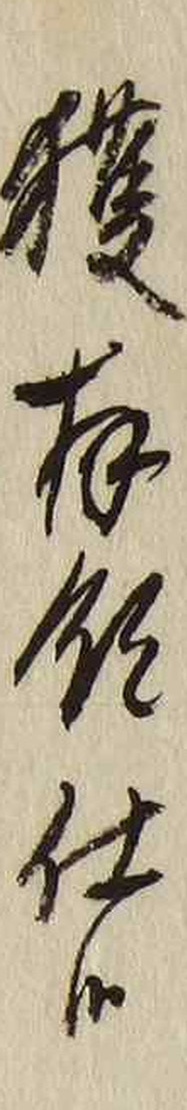獲拝領仕候
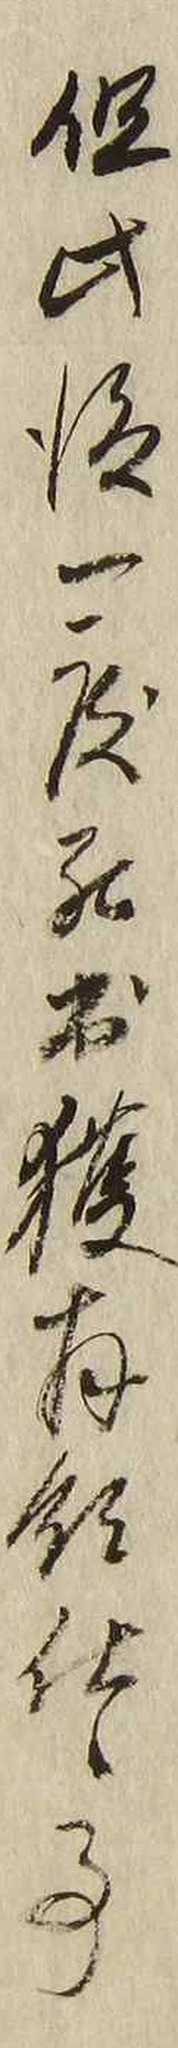但此後一度罷出獲拝領仕候事

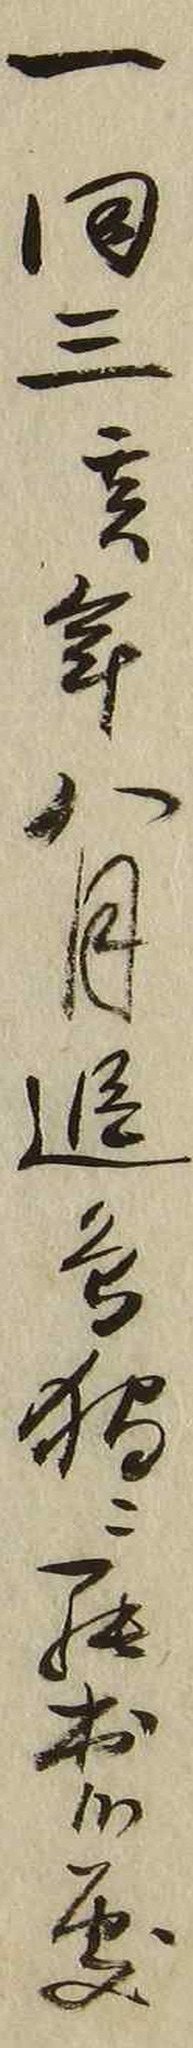一同三亥年八月追鳥狩ニ罷出候処
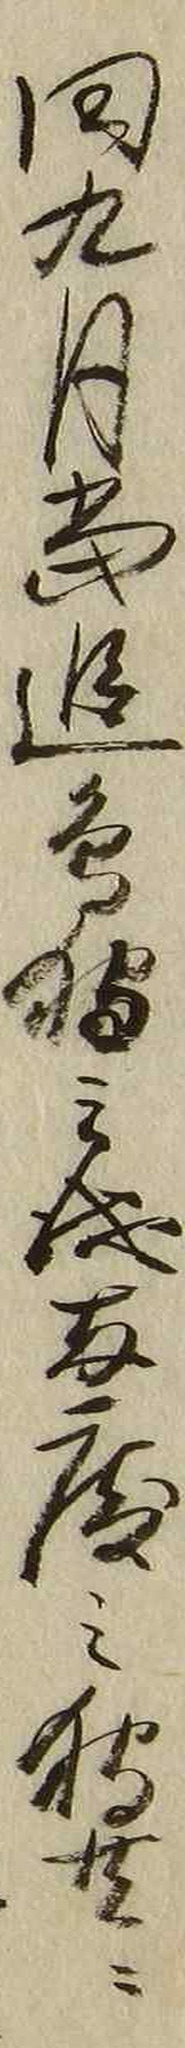同九月当追鳥狩之儀両度之狩共ニ
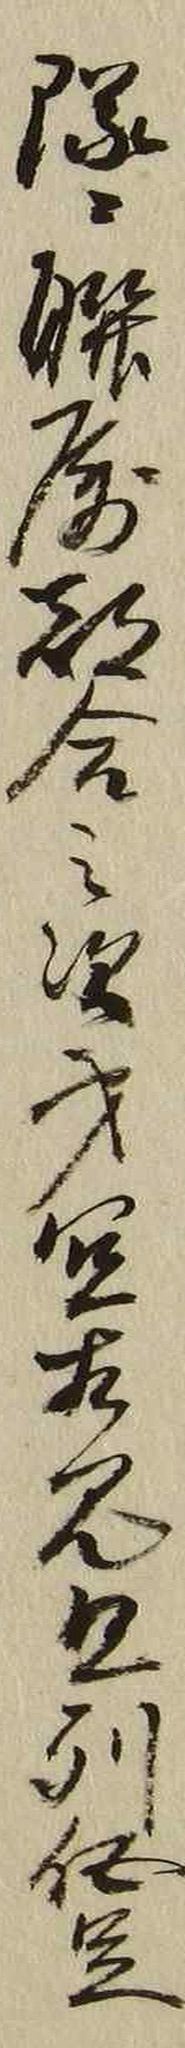隊々聯属都合之次第宜相見且列伍足
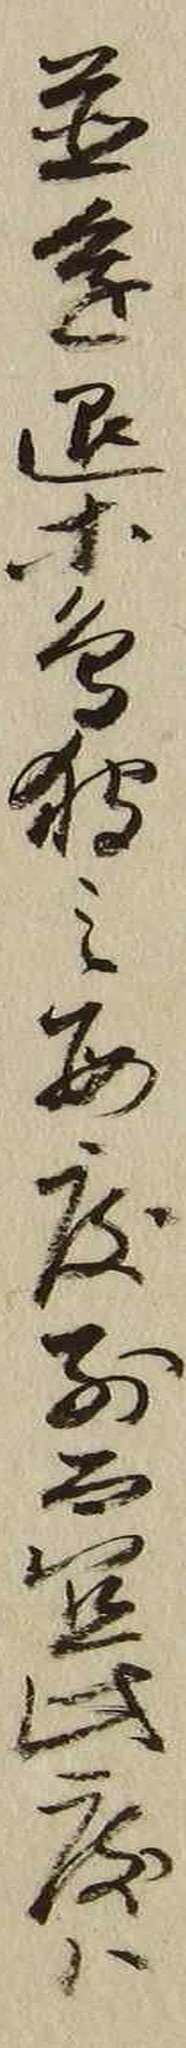並進退等鳥狩之毎度別而宜此度ハ
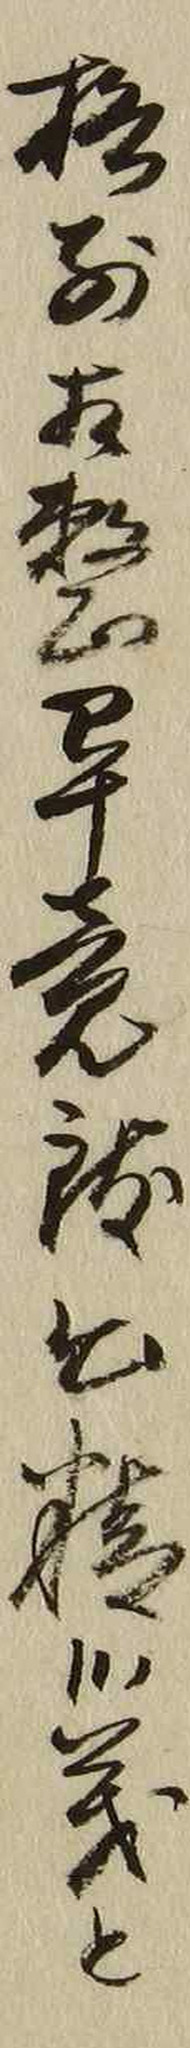格別相整畢竟致出精候義と
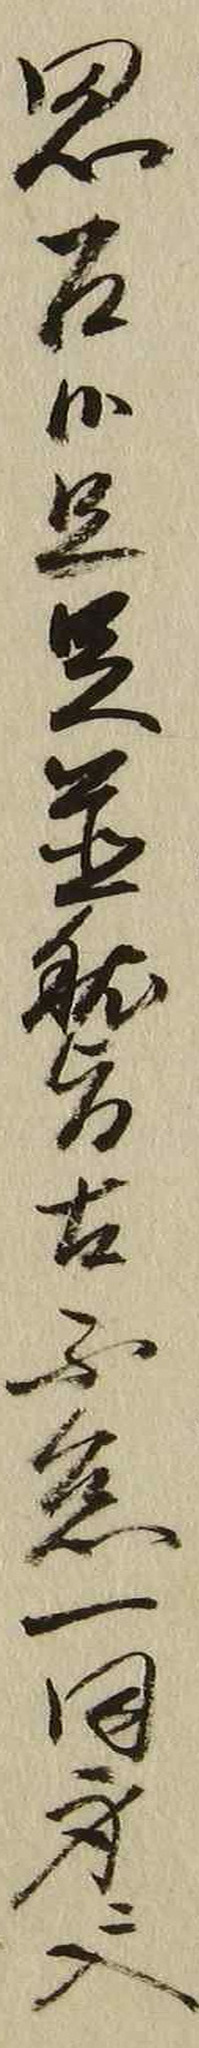思召候且足並稽古不怠一同身ニ入
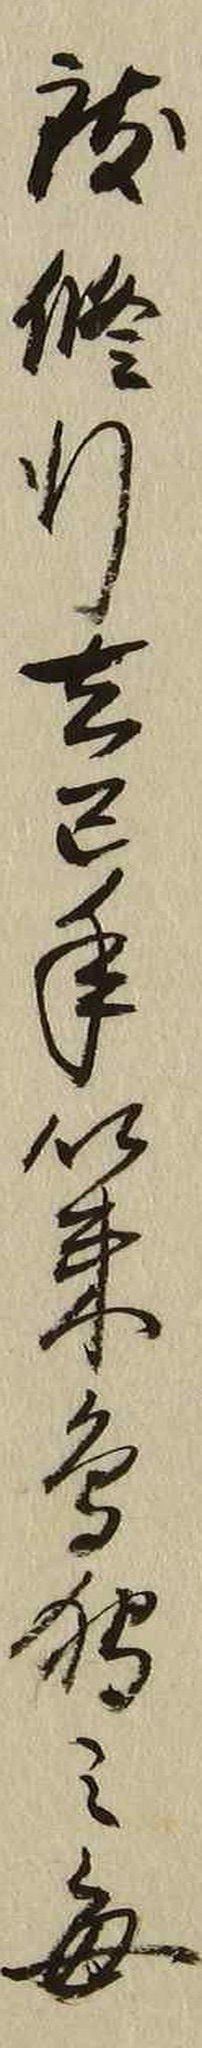致修行去巳年以来鳥狩之毎
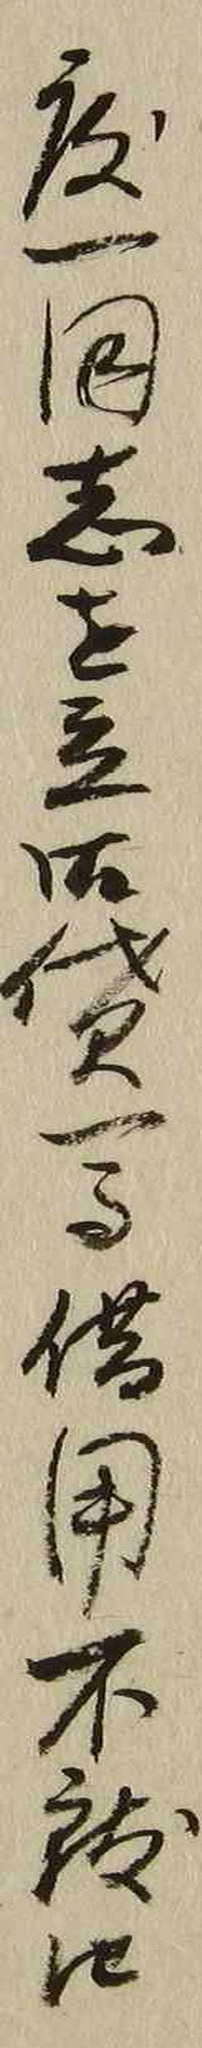度一同志を立御貸馬借用不致由
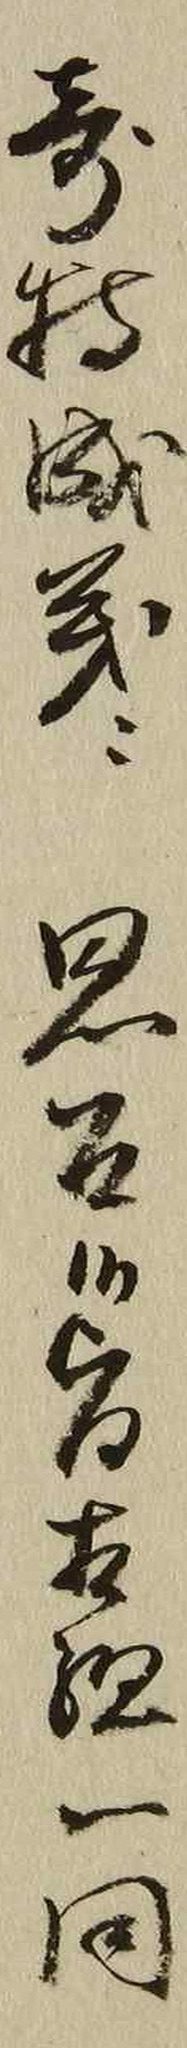奇特成義ニ思召候旨相組一同
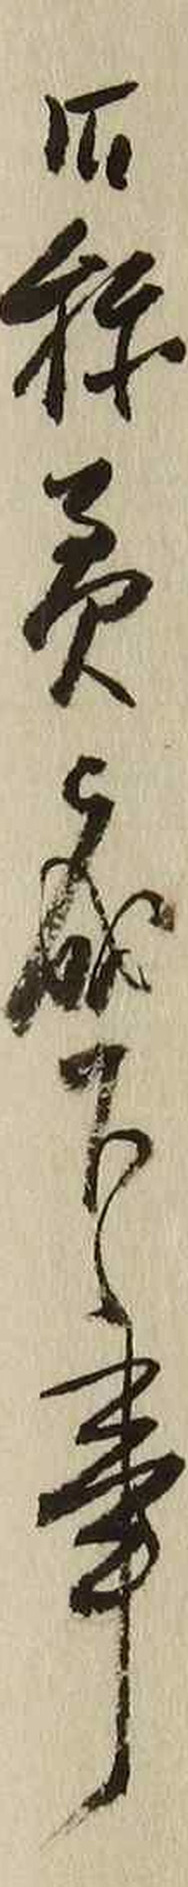御称美被成下候事
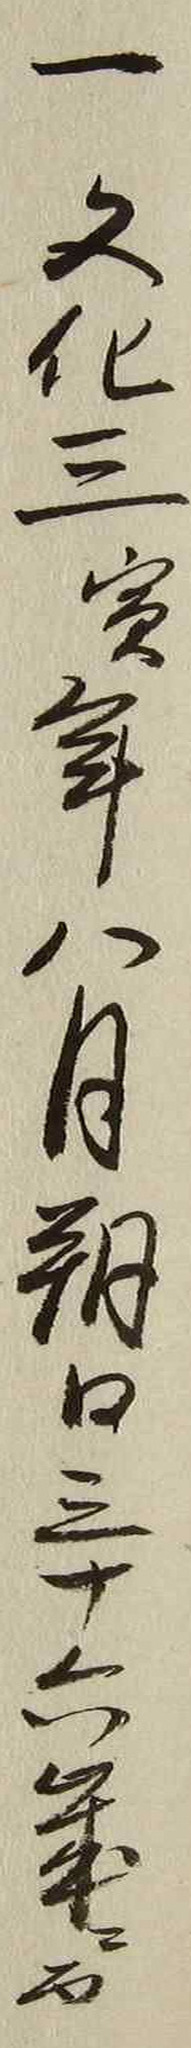一文化三寅年八月朔日三十六歳ニ而
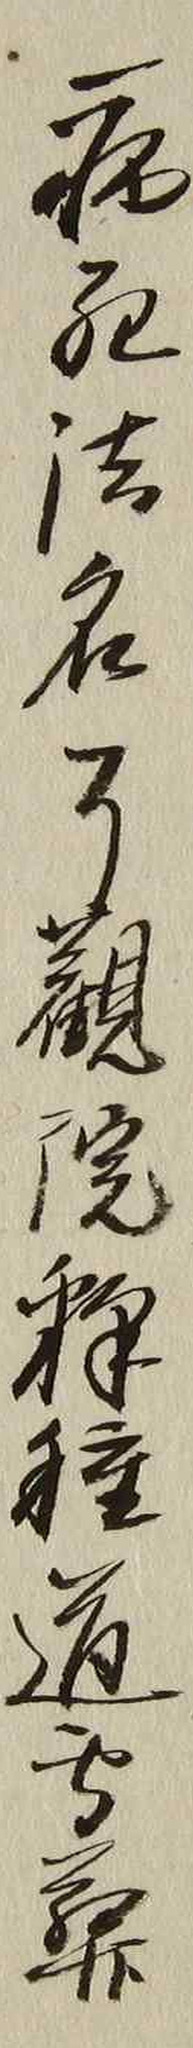病法名了観院釈種道専葬
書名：諸士系譜　巻之356　す之部6
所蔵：会津若松市立会津図書館
